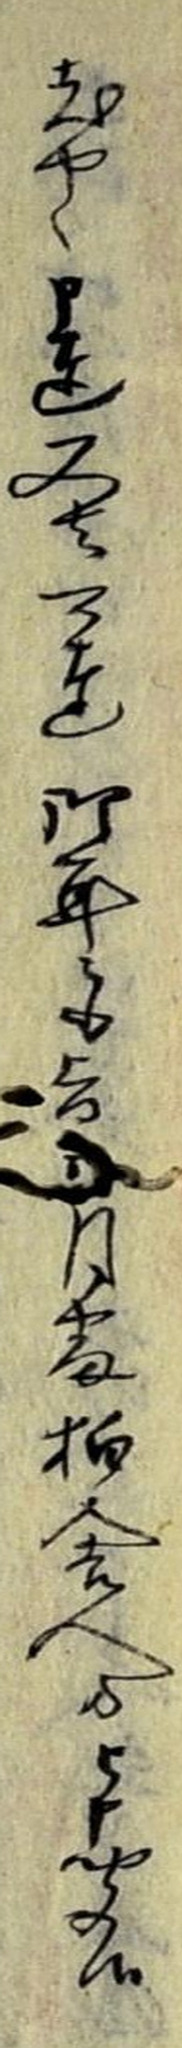老中へ申達又者可達御耳ニも旨御月番狛舎人方被申聞候
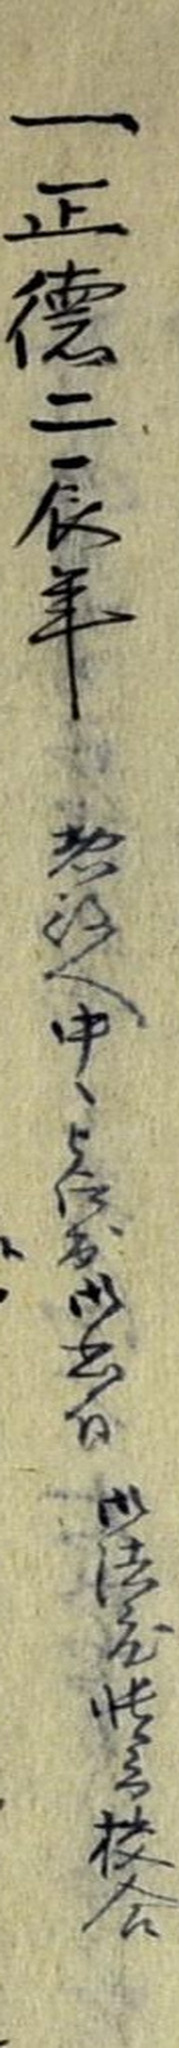一正徳二辰年惣役人中へ被仰出御書付御法度帳ニ而校合
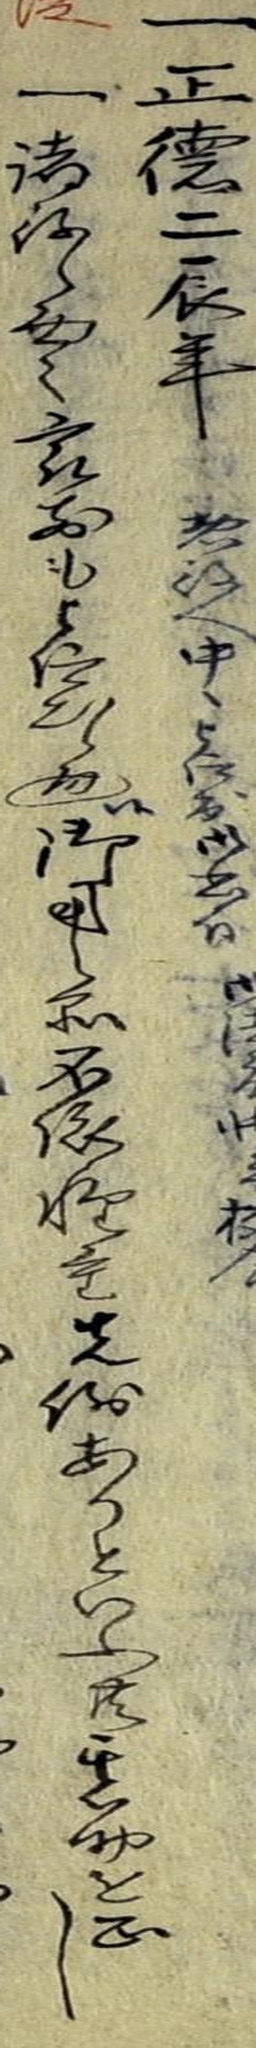一諸役之面々最前も被仰出候通候御用之品不依軽重先例ありといふ共其筋を正し
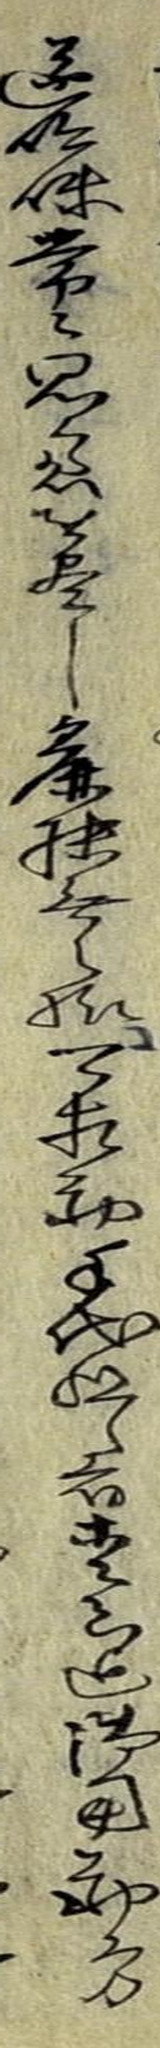遂吟味常々思慮を尽し麁抹無之様尓可相勤手代組之者等ニ至迄御用勤方
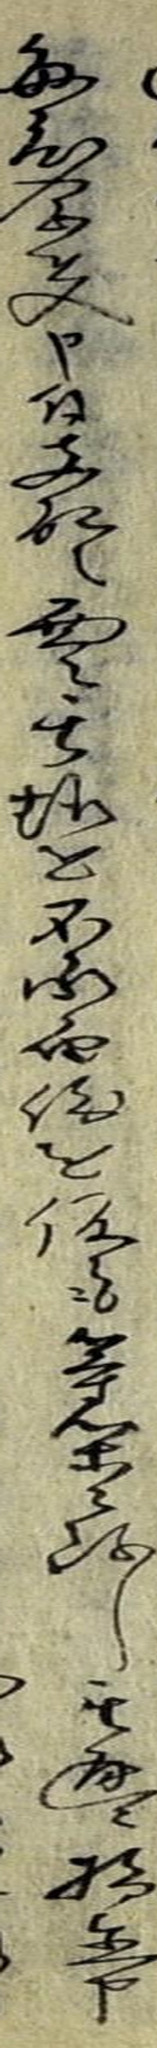毎度念を入申付支配之面々其趣を不承届儀を仮ニも等閑ニ致し其通ニ指置申
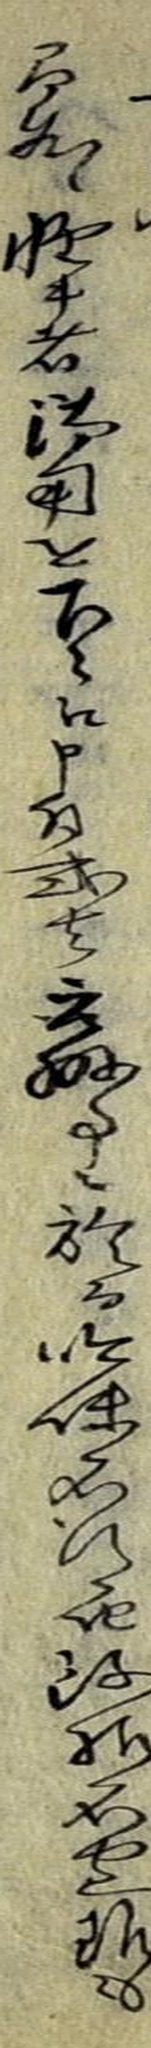間敷候軽キ者御用を下々江申付或者取扱事ニ於而吟味不行届致様不宜趣も
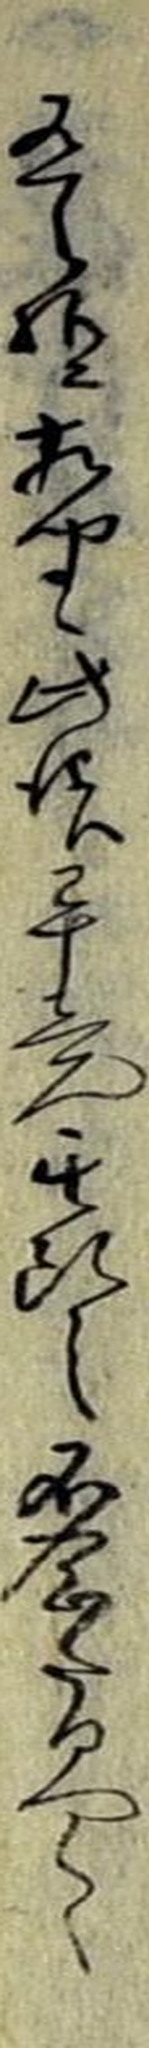有之様ニ相聞候此儀ハ畢竟其頭之不念たるへく候
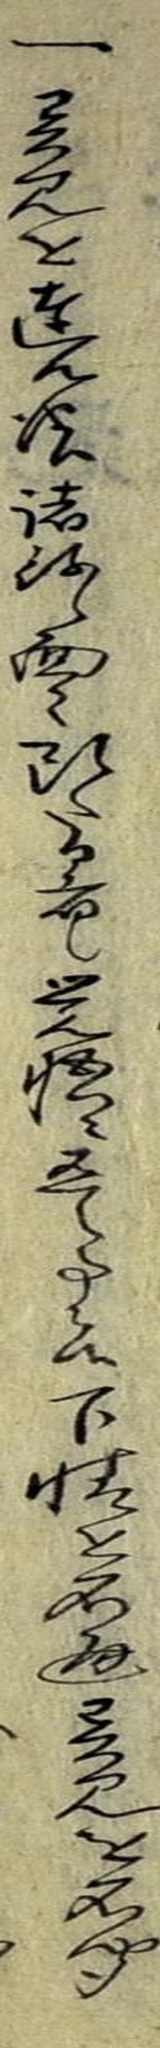一異見を達ル儀ハ諸役之面々頭たる者之覚悟ニ有之事ニ候下情と不通異見を不聞
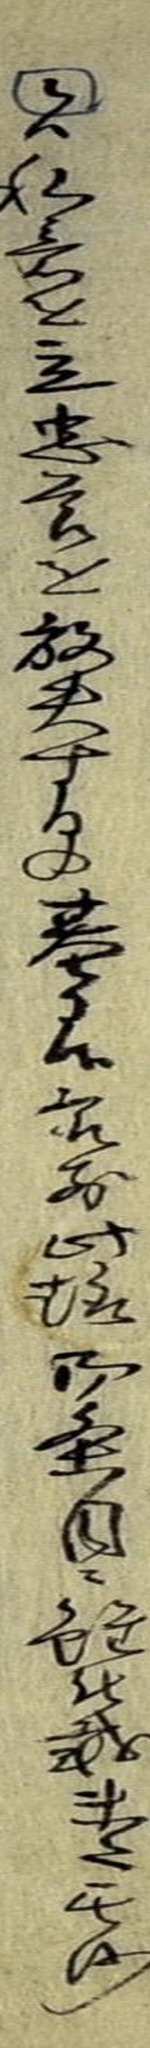候ハ私意を立忠節を放失するの基り候最前此趣御条目ニ雖被載未た其沙
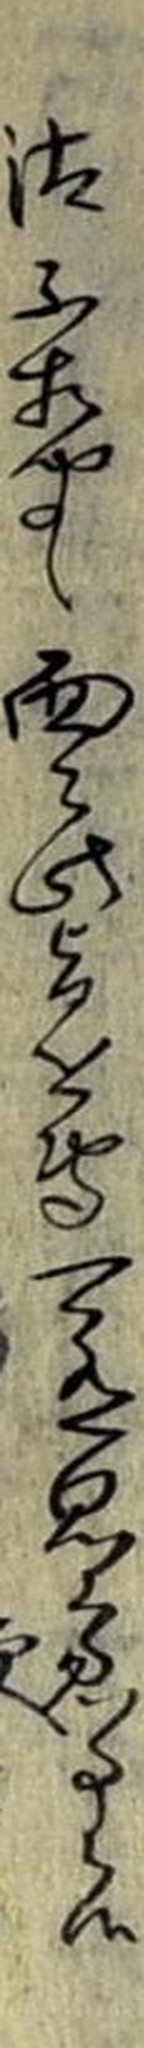汰不相聞候面々此旨を専可有思慮事ニ候
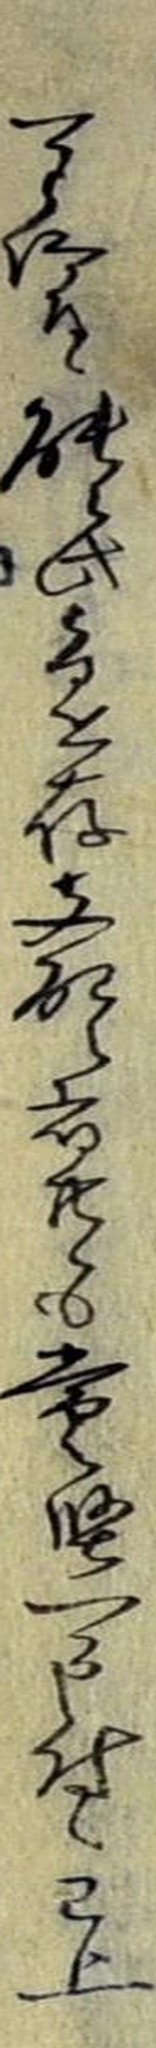可被仰付候能々此旨を存支配之者共へも常々堅可申付候已上
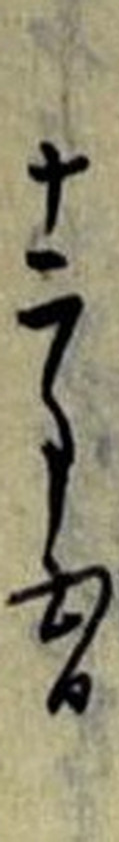十二月五日
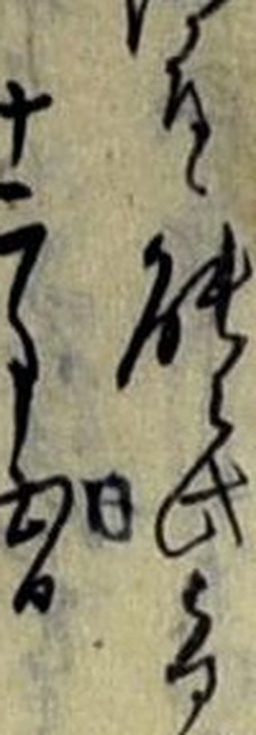十二月五日
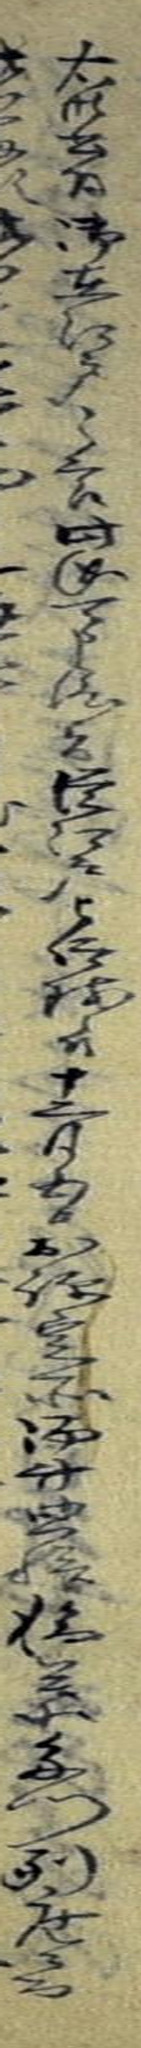右御書付御在江戸之節此趣可申渡旨従江戸被仰越ニ付十二月五日於評定所酒井典膳稲葉多門列座ニ而
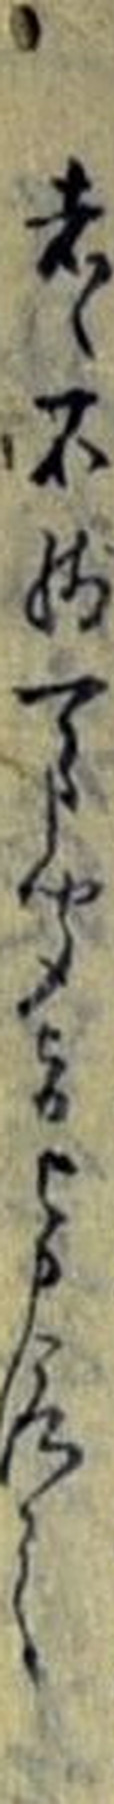者へ不残可申聞旨被申渡之
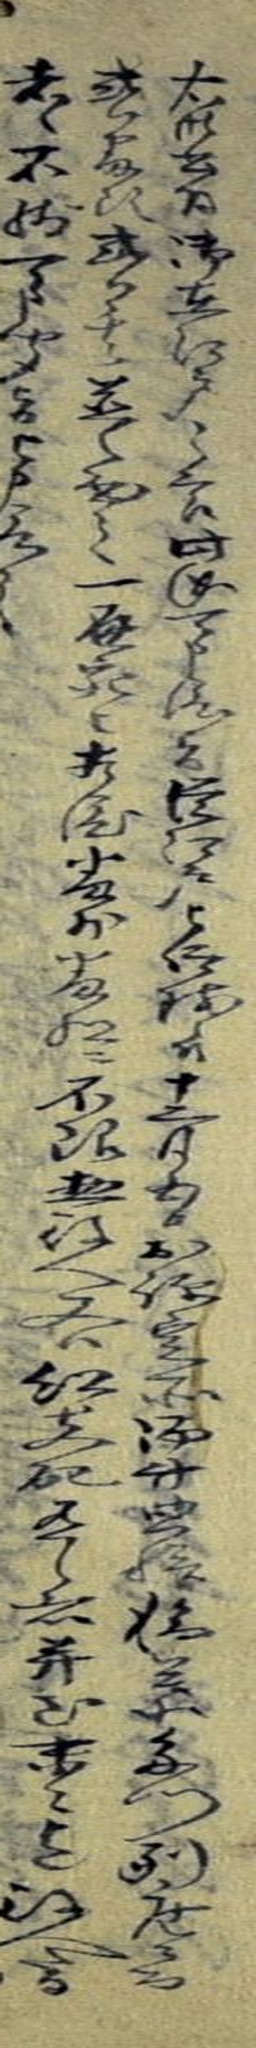或ハ番頭或ハ其並之面々へ一通宛被相渡番外番組ニ不限惣役人又ハ組支配有之者并至末々迄役人たる
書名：命令之部 一
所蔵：福井県文書館 Fukui Prefectural Archives
